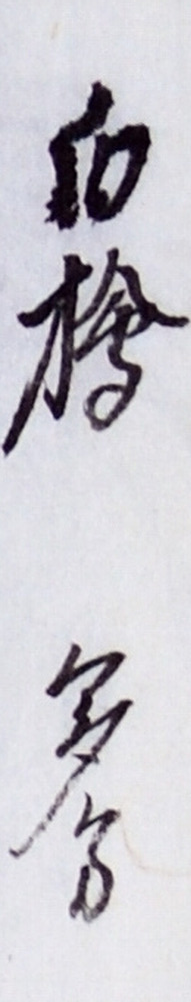白檜多方
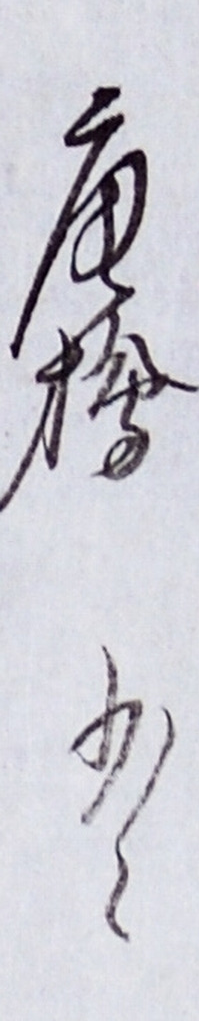唐檜少々
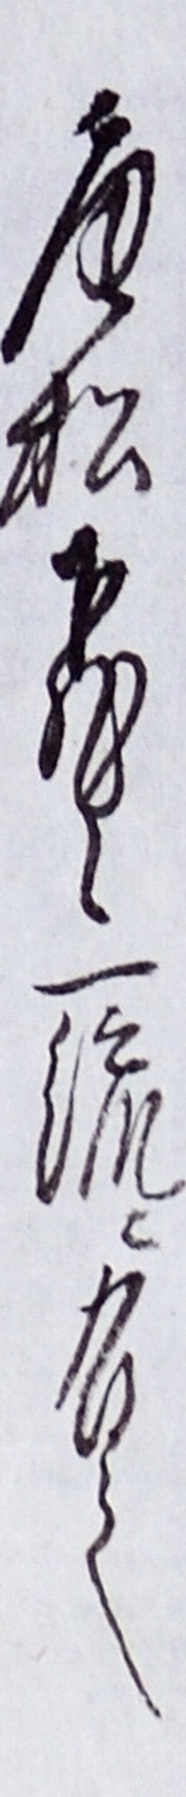唐松下飛々一流ニ有之
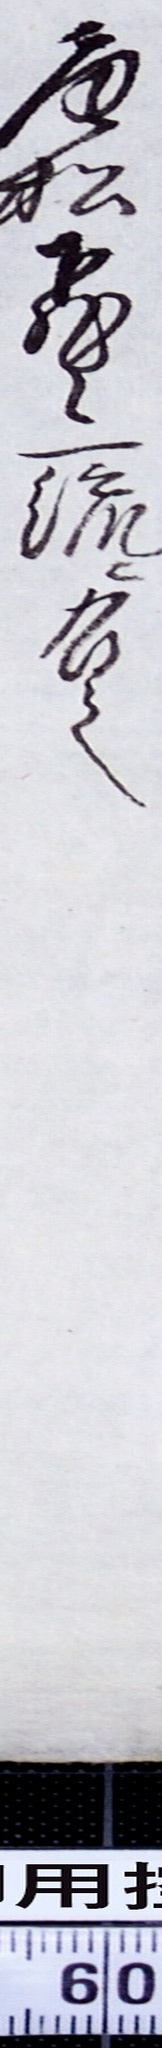唐松下飛々一流ニ有之
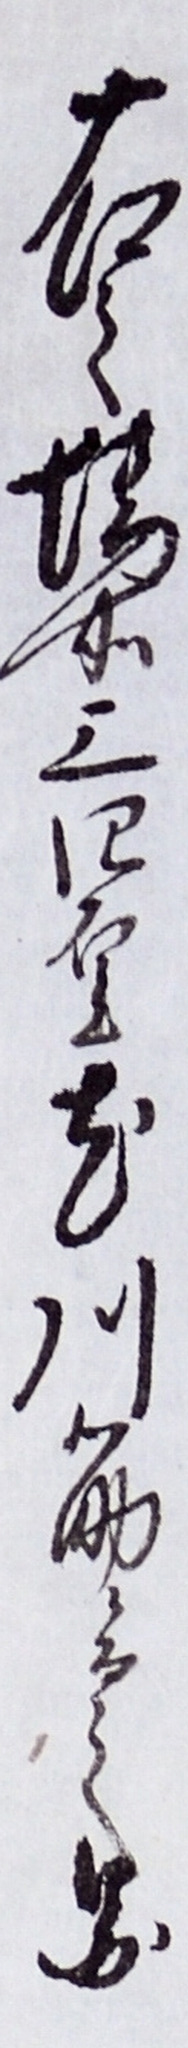一右之場所三四厘尤川筋ニ而之図
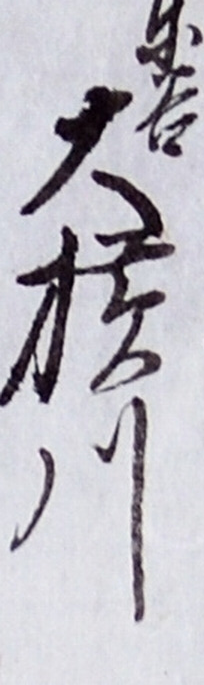大横川
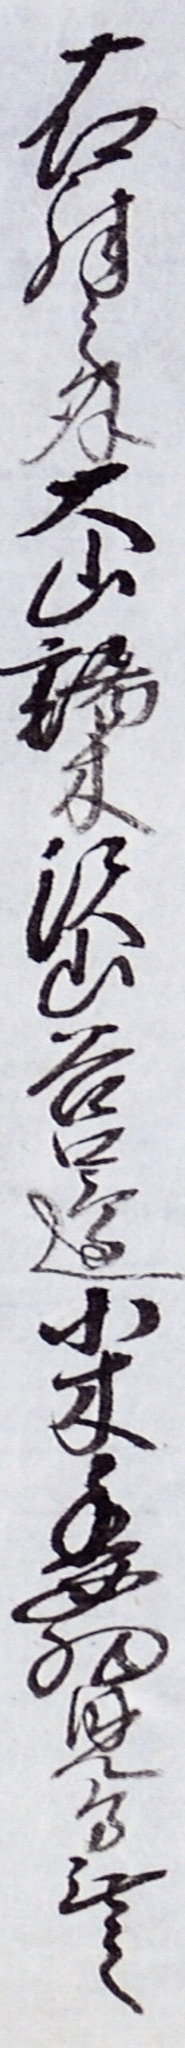右殊之外大山諸木沢山谷口辺小木委細見方無之
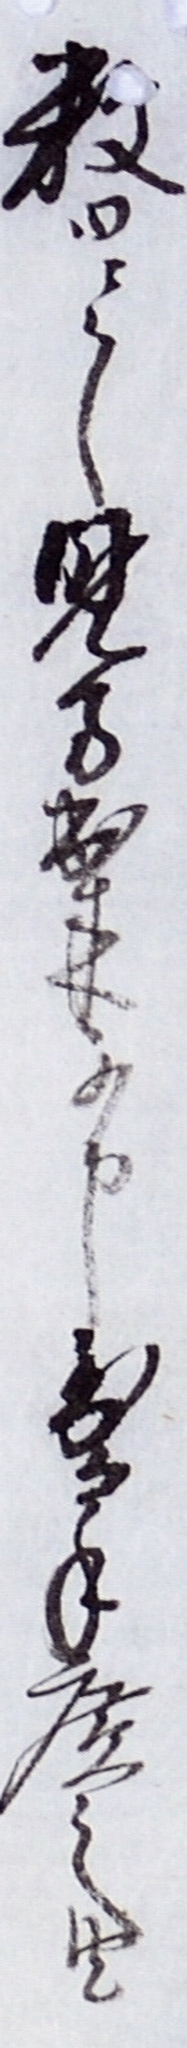数日ニて見方出来可申至而手広之由
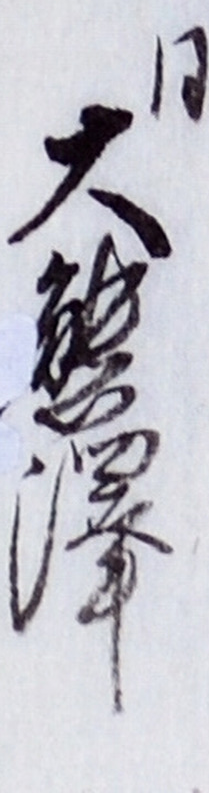大熊澤
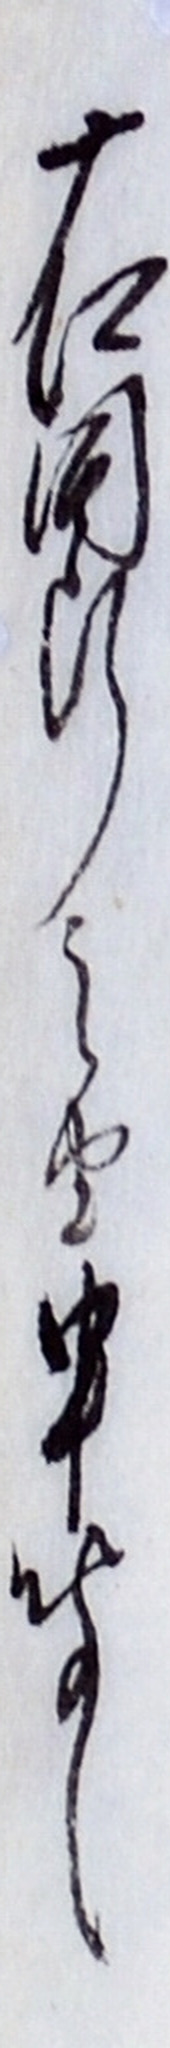右同断之由申聞候
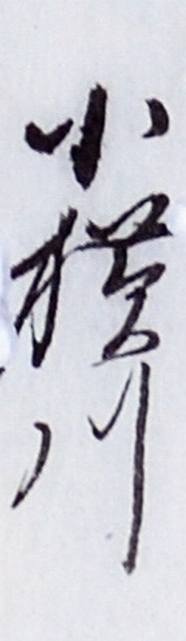小横川
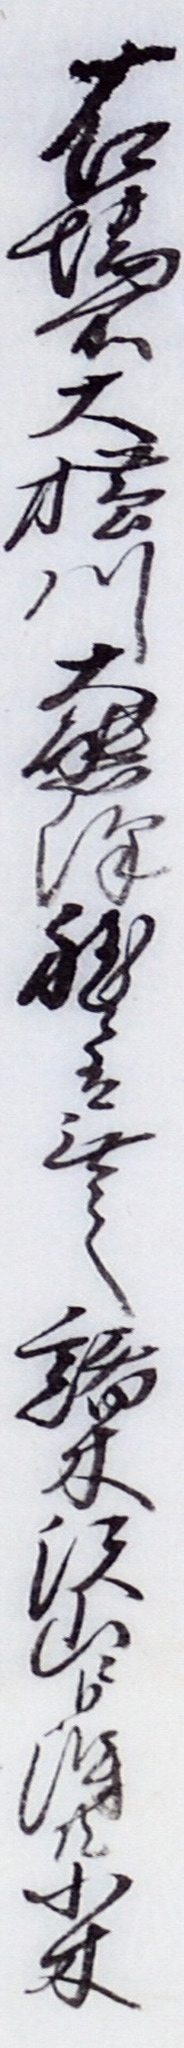右場所大横川大熊澤程ニは無之諸木沢山ニ候得共小木
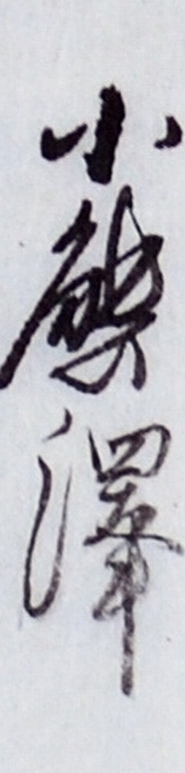小熊澤
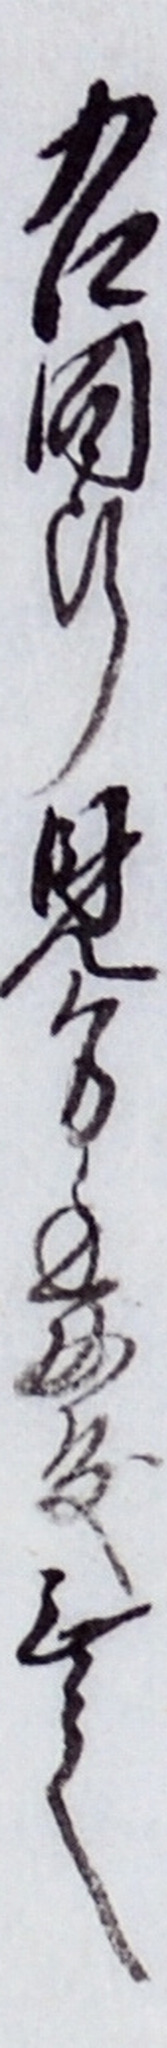右同断見分委敷無之
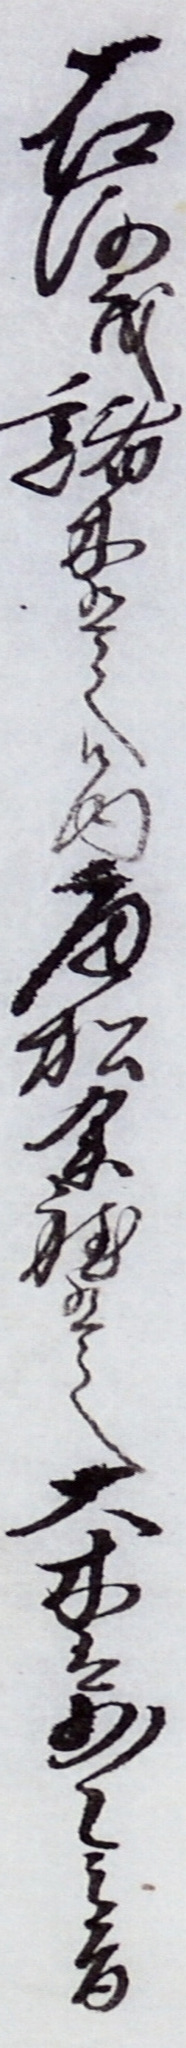右何も諸木有之候内唐松余程有之大木は少々之旨
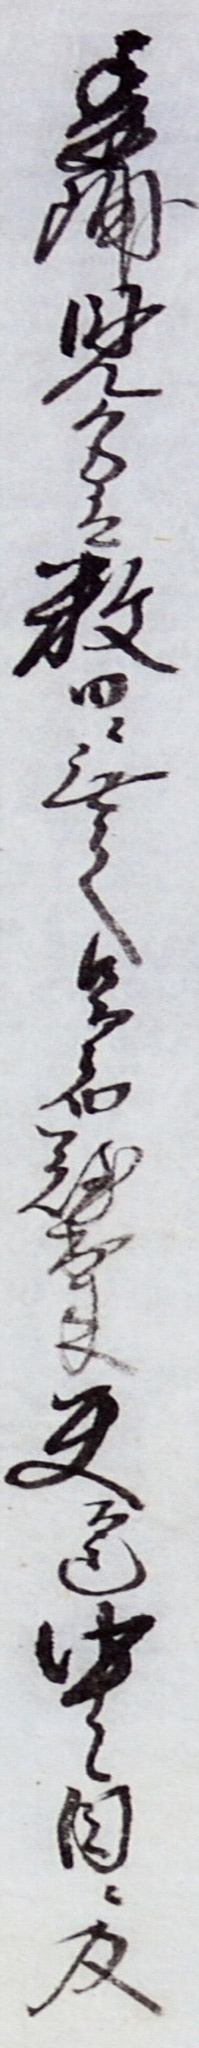委鋪見分は数日ニ無之候而届難出来夫而已中々目ニ及
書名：御山奉行御用控
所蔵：伊那市立高遠町図書館・合同会社AMANE
